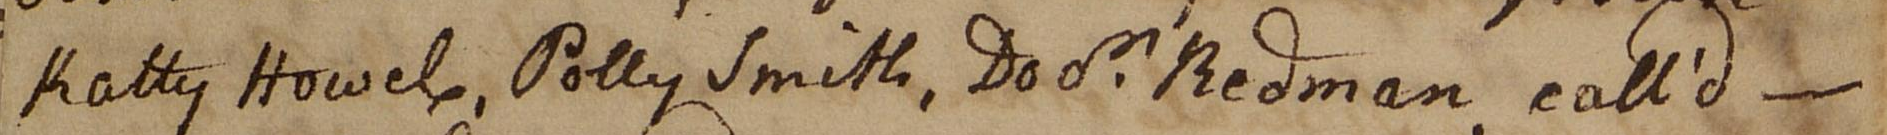Katty Howel, Polly Smith, Doc^r. Redman, call'd -
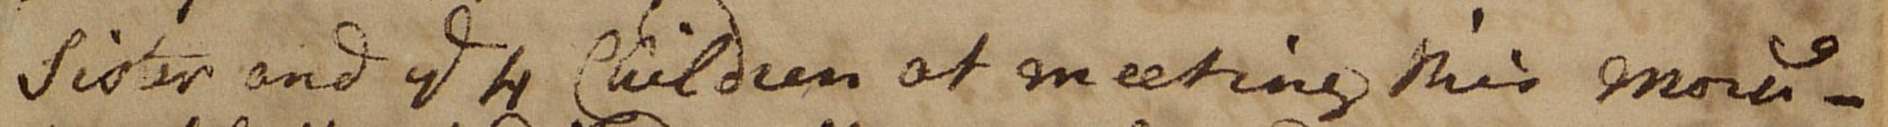Sister and y^e 4 Children at meeting this morn^g-
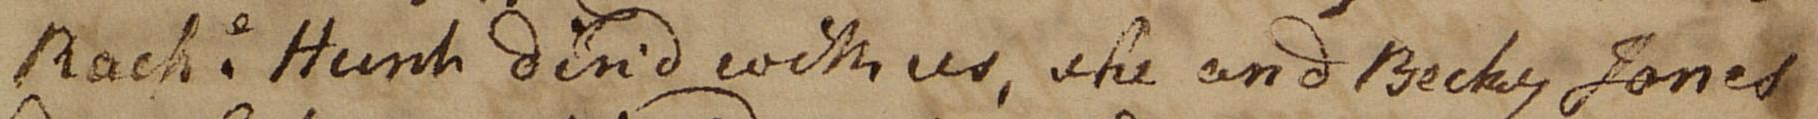Rach^l. Hunt din'd with us, she and Becky Jones
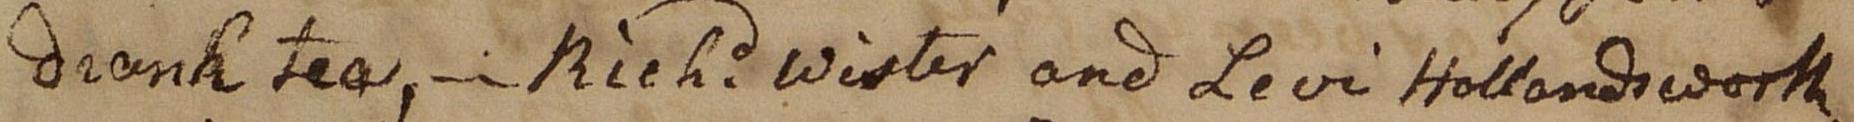drank tea,- Rich^d. Wister and Levi Hollandsworth,
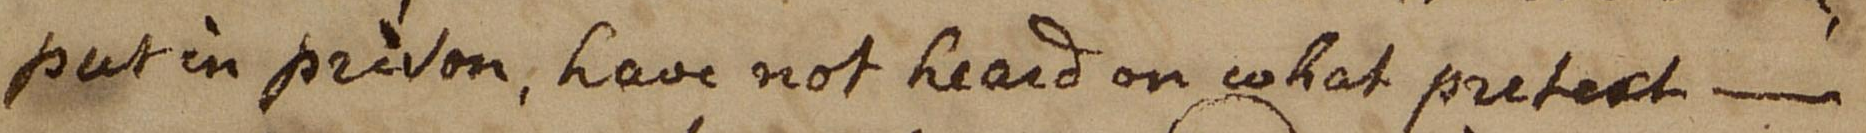put in prison, have not heard on what pretext-
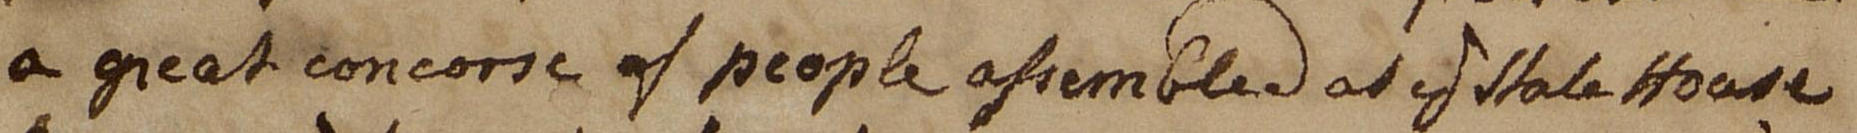a great concorse of people assembled at y^e State House
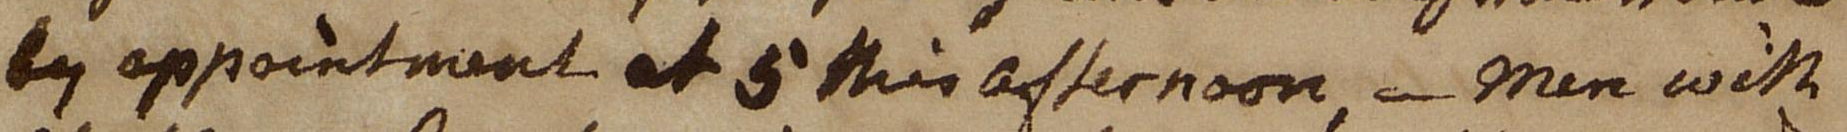by appointment at 5 this afternoon- men with
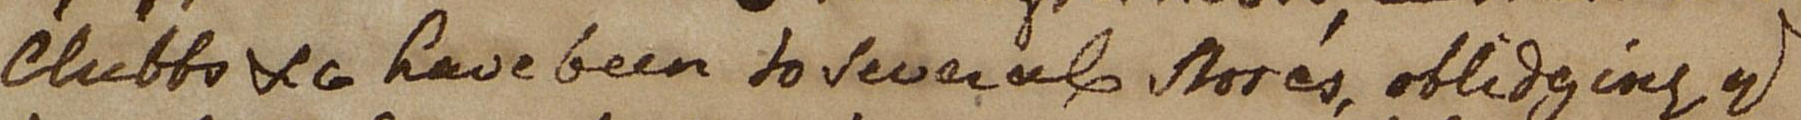Clubbs &c have been to several stores, oblidging y^e
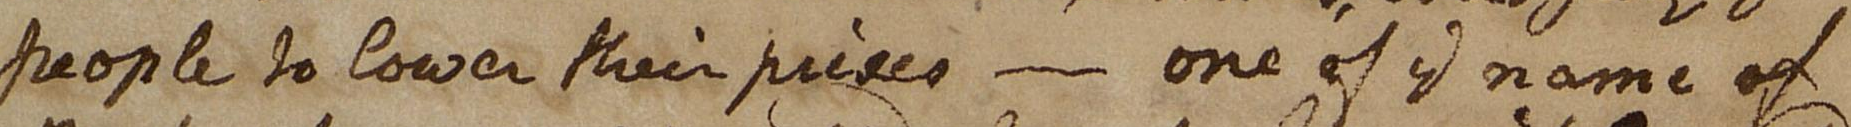people to lower their prices- one of y^e name of
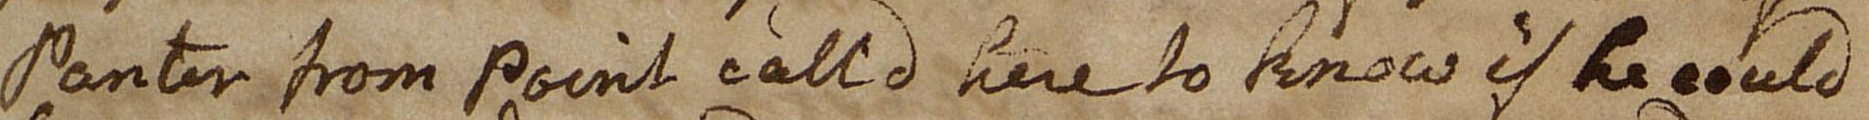Panter from Point call'd here to know if he could
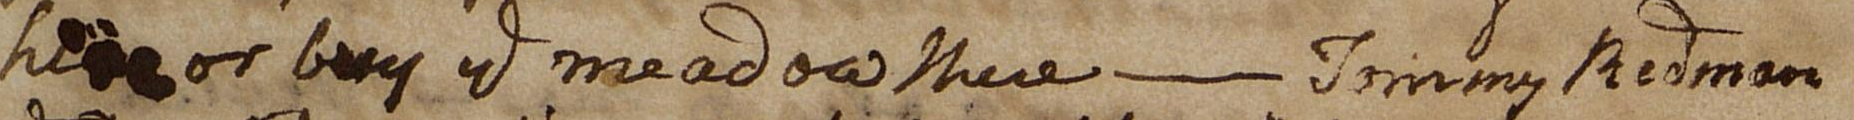hire or buy y^e meadow there- Tommy Redman
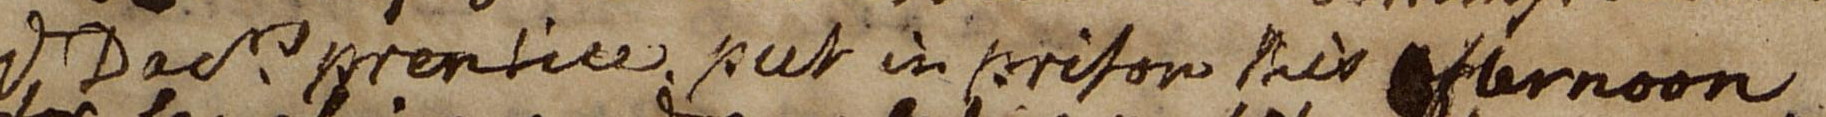y^e Doc^rs. prentice, put in prison this afternoon
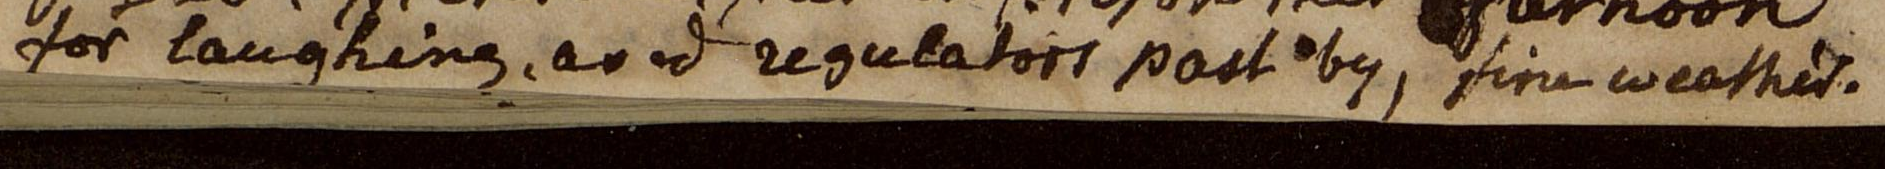for laughing. as y^e regulators past by, fine weather
